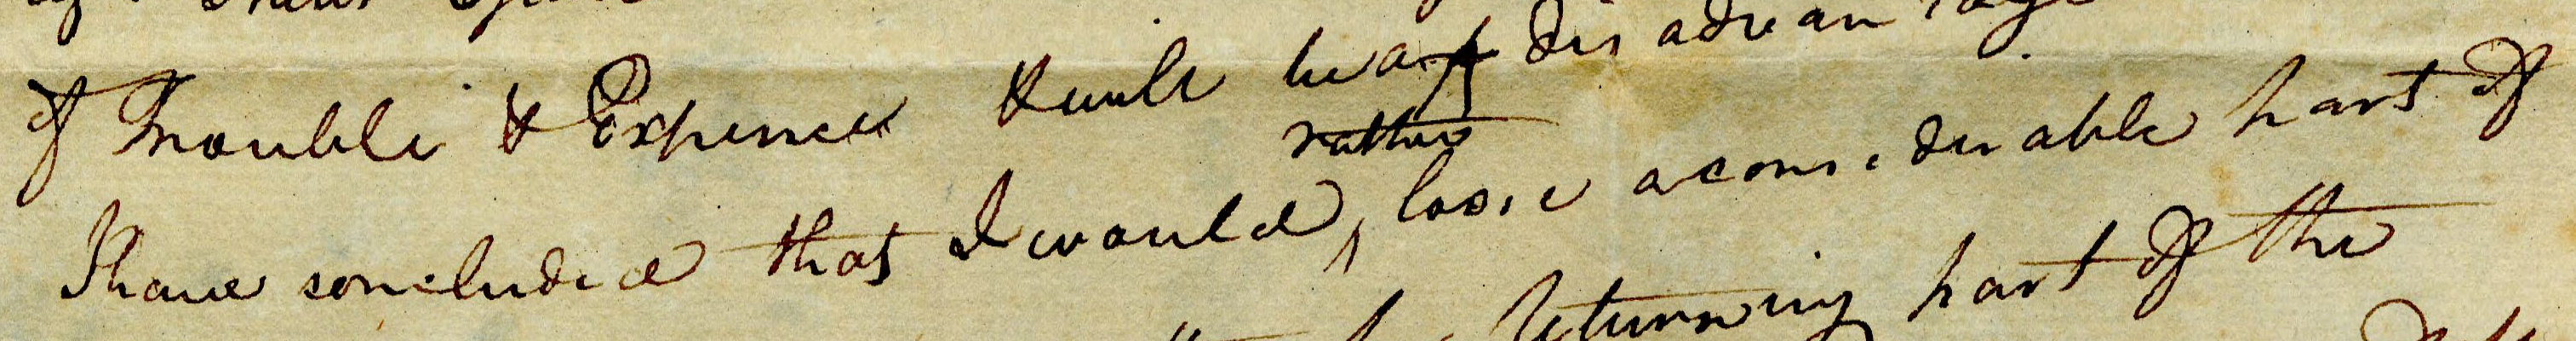I have concluded that I would ^ loose a considerable part of
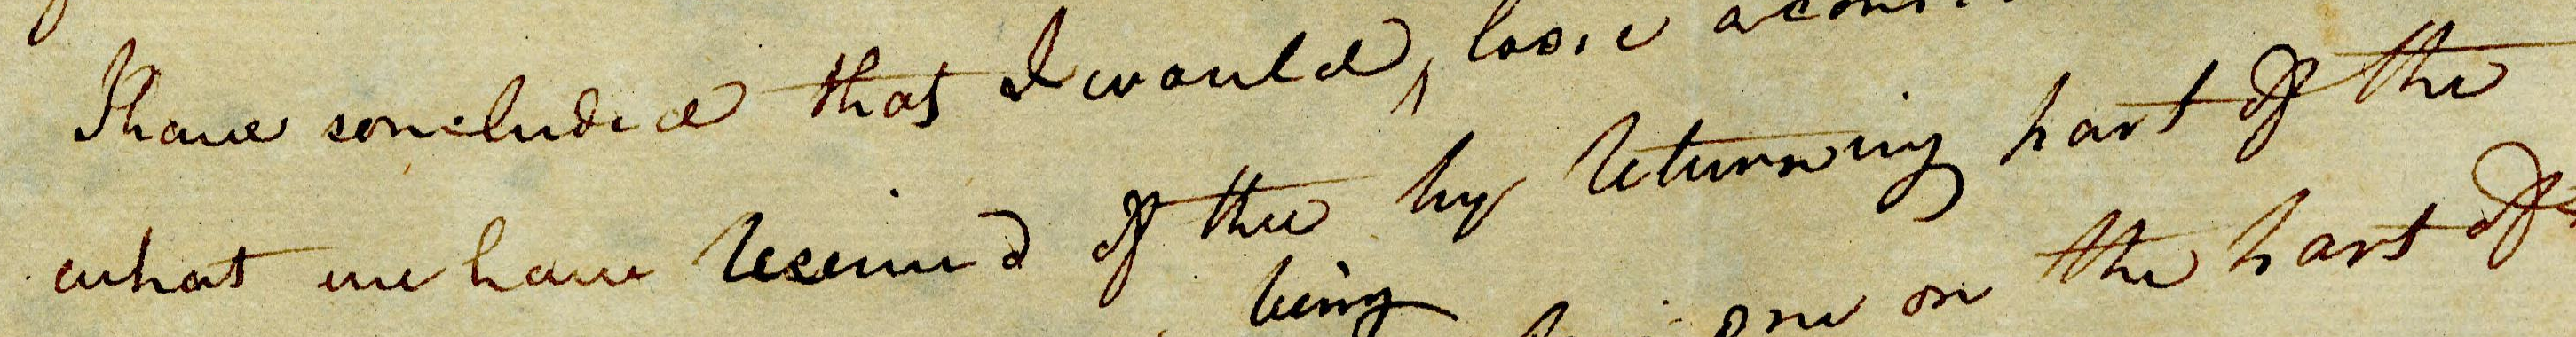what we have received of thee by returning part of the
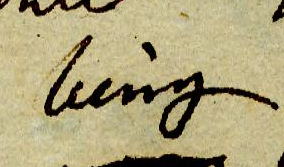being
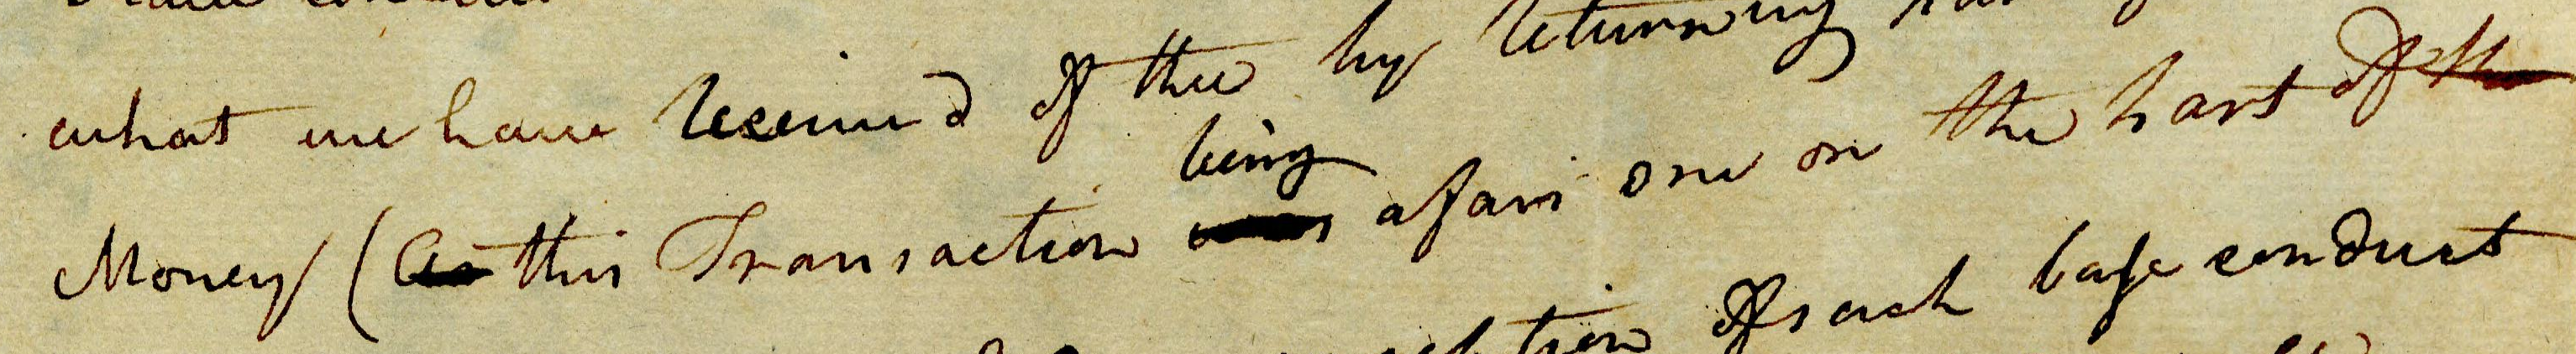Money (this transaction [was] a fam: one on the part of [the]
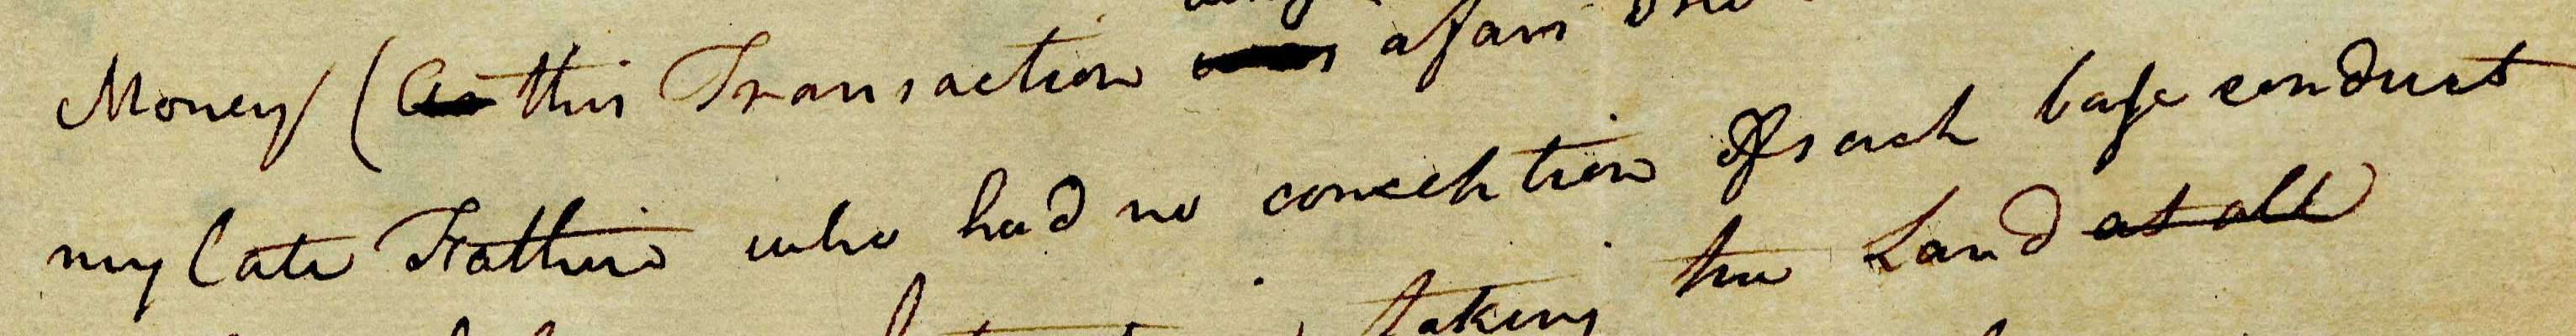my Late Father who had no connection of such base conduct
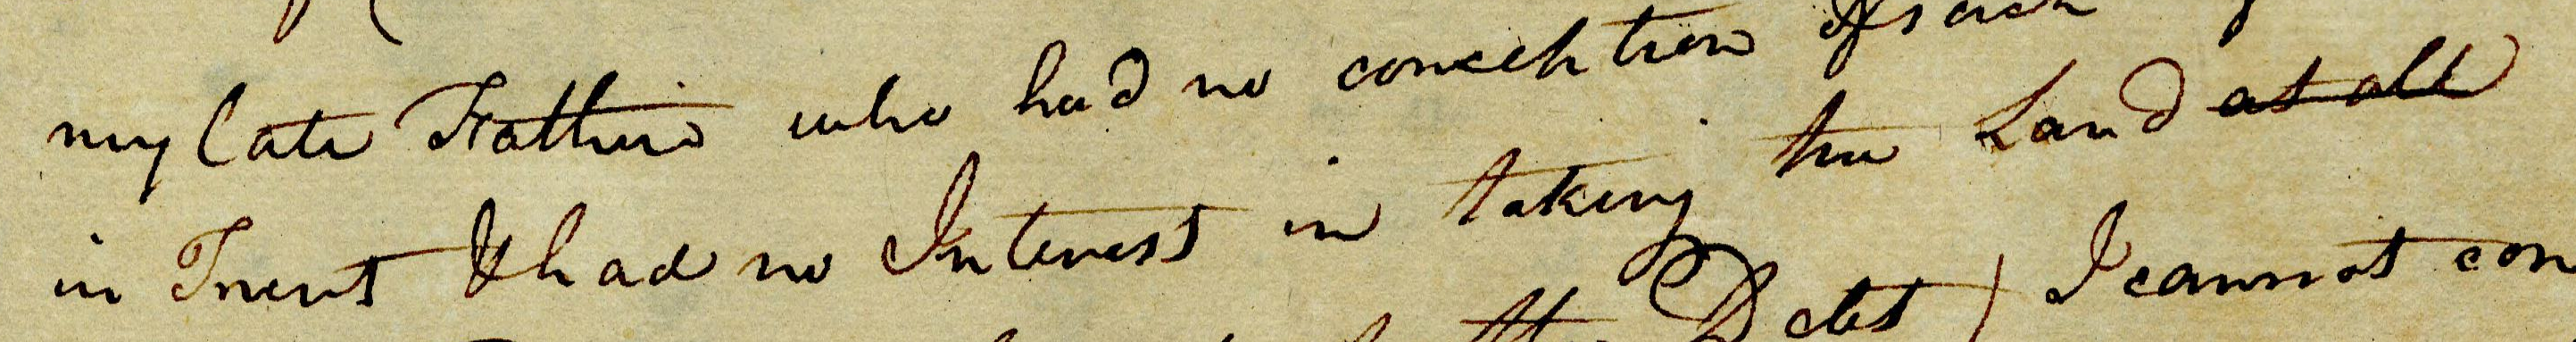in Trent & had no interest in taking to Land [at all]
